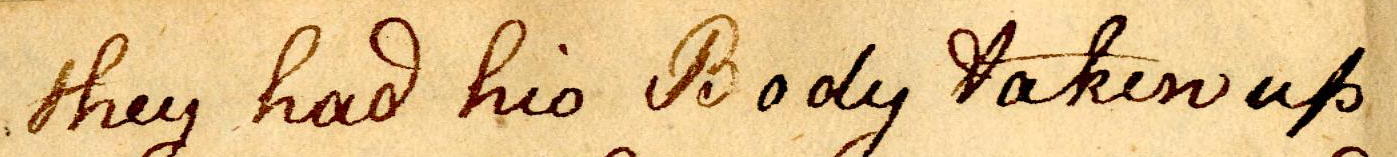they had his Body taken up
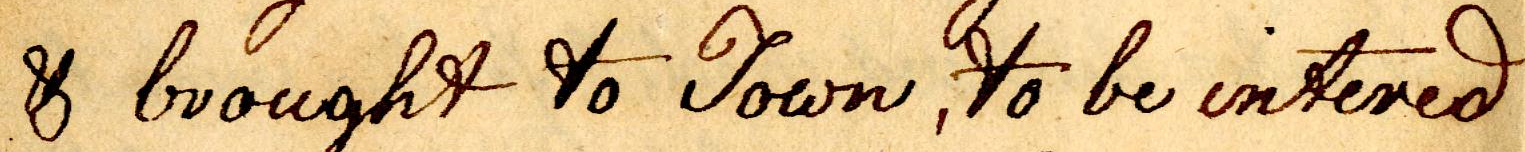& brought to Town, to be intered
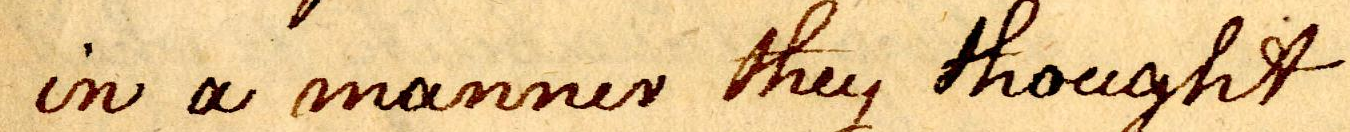in a manner they thought
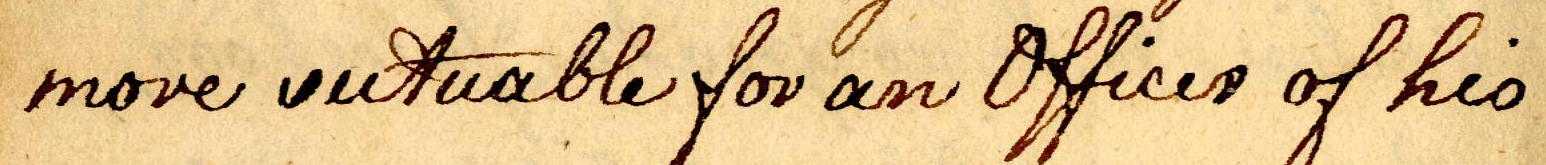more sutuable for an Officer of his
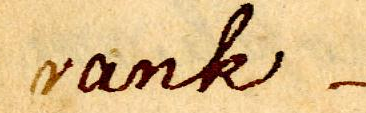rank -
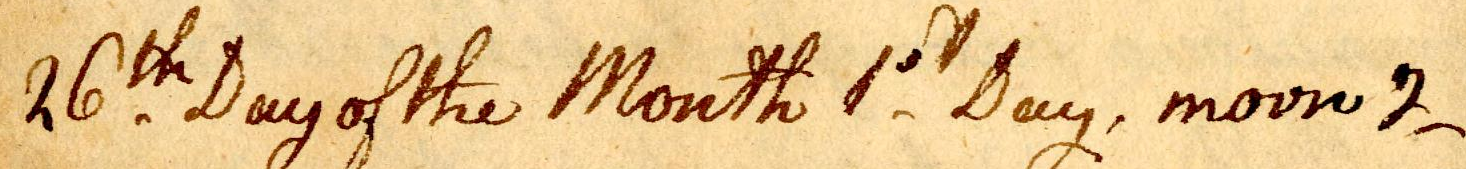26^th. Day of the Month 1^st Day. morn ^g
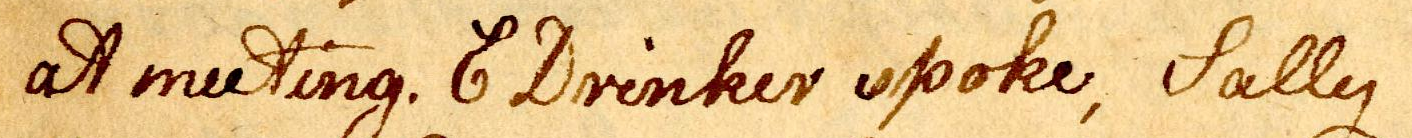at meeting. E Drinker spoke, Sally
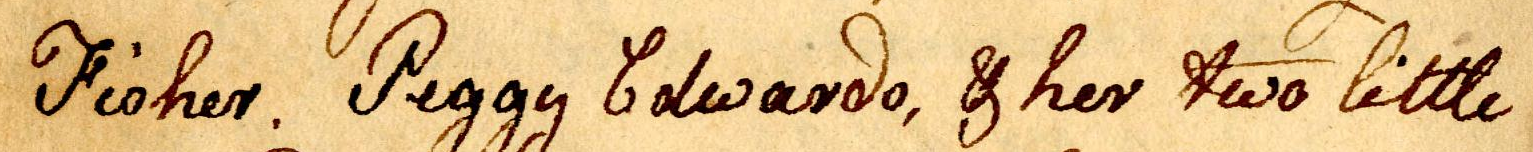Fisher, Peggy Edwards, & her two little
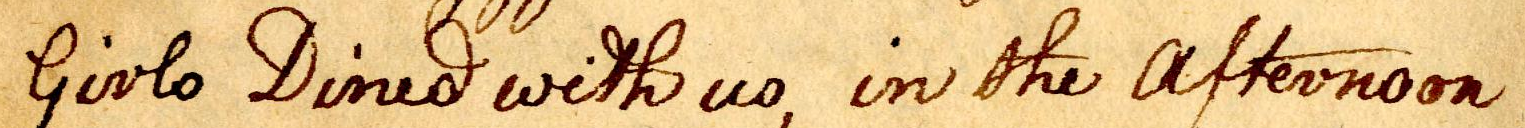Girls Dined with us, in the Afternoon
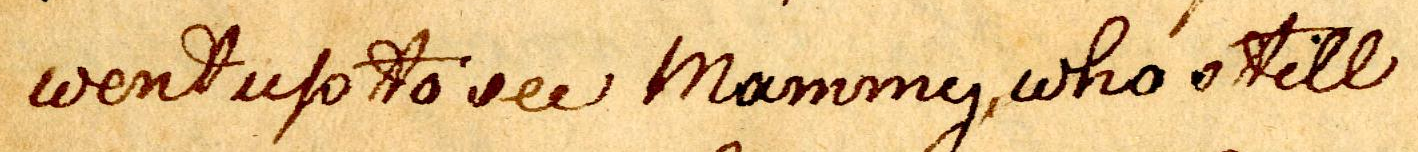went up to see Mammy, who still
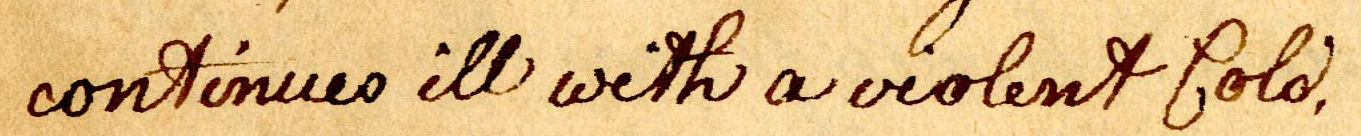continues ill with a violent Cold,
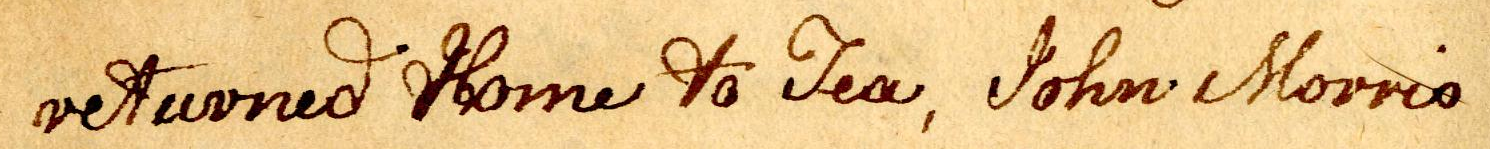returned Home to Tea, John Morris
